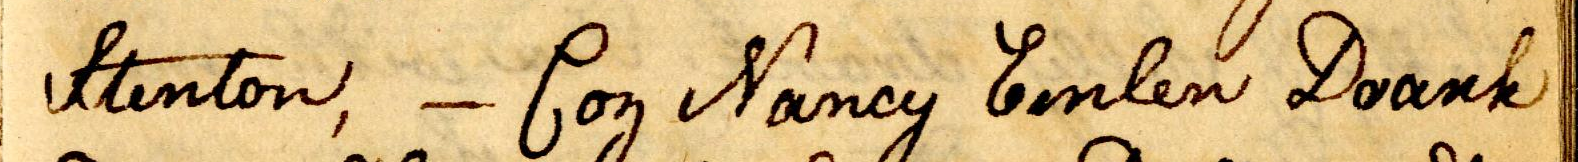Stenton,- Coz Nancy Emlen Drank
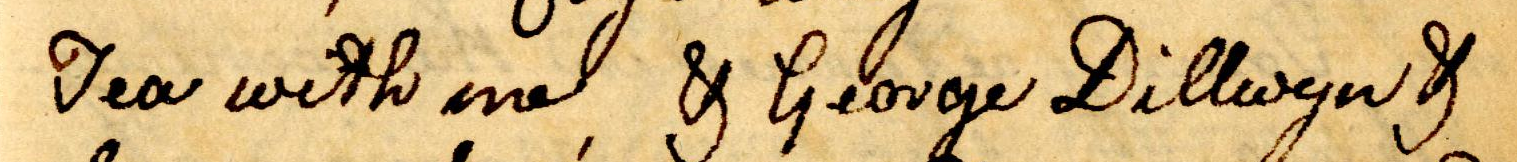Tea with me, & George Dillwyn &
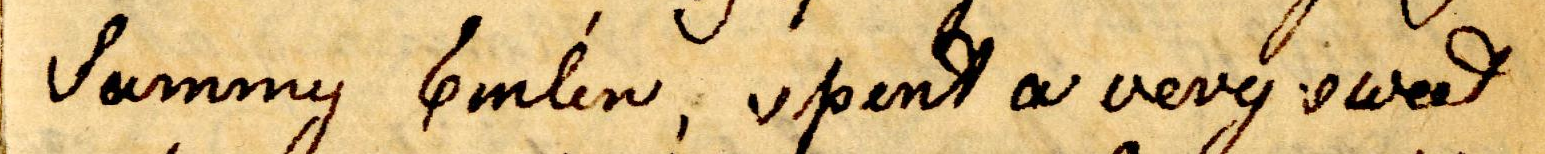Sammy Emlen, spent a very sweet
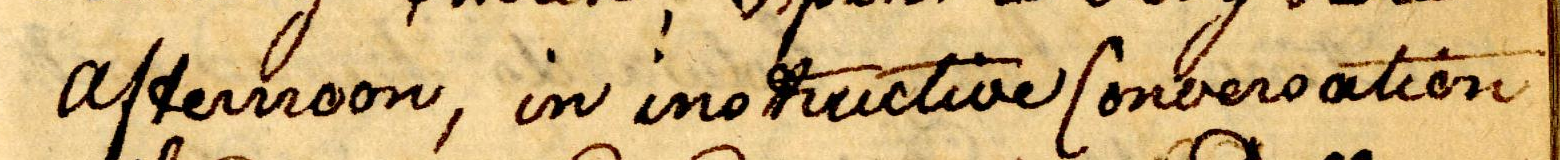Afternoon, in instructive Conversation
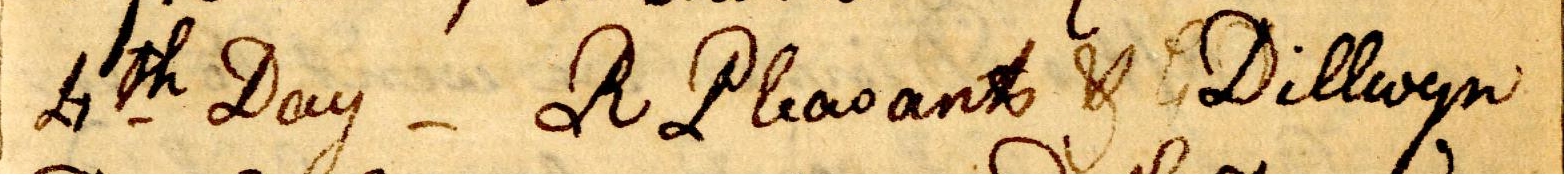4^th Day- R Pleasants & GDillwyn
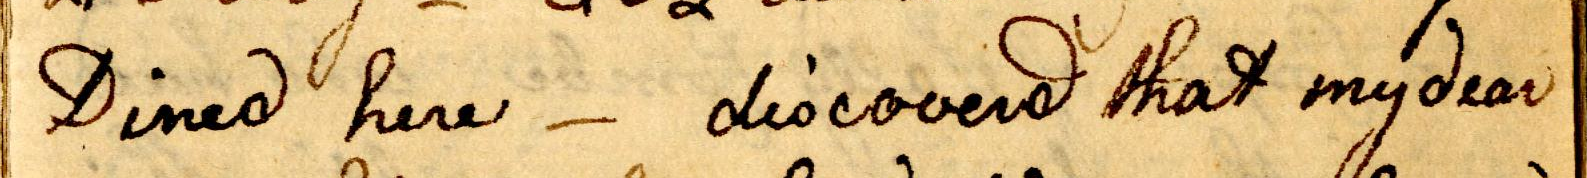Dined here- discoverd that my dear
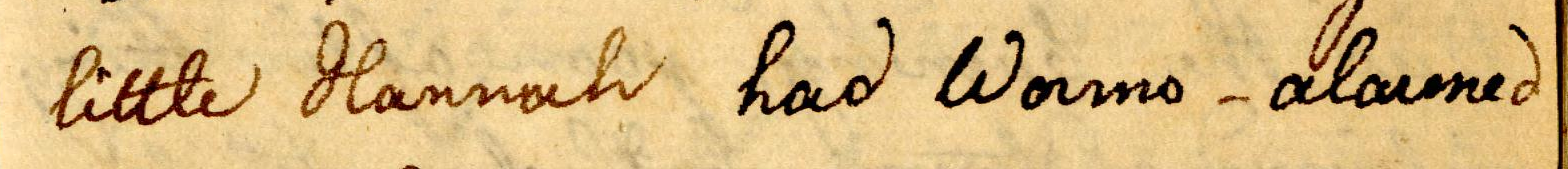little Hannah had Worms- alarmed
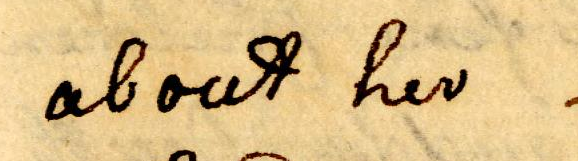about her -
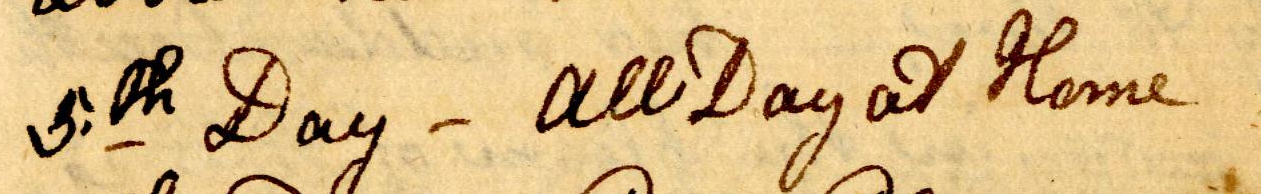5^th Day- All Day at Home
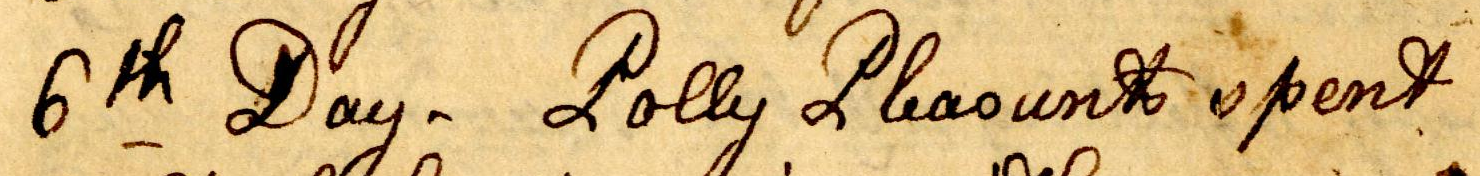6^th Day- Polly Pleasants spent
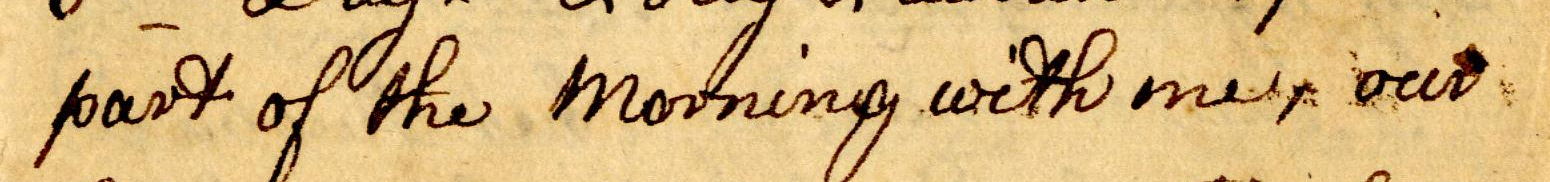part of the morning with me, our
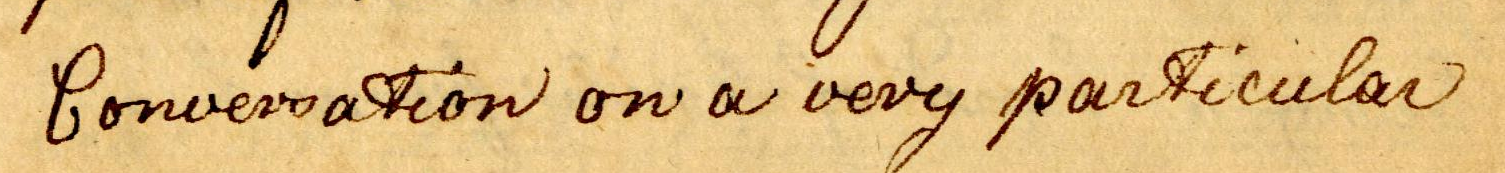Conversation on a very particular
